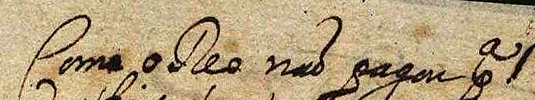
Como o Reo naõ pagou pa
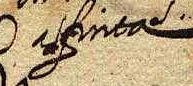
as fintas.
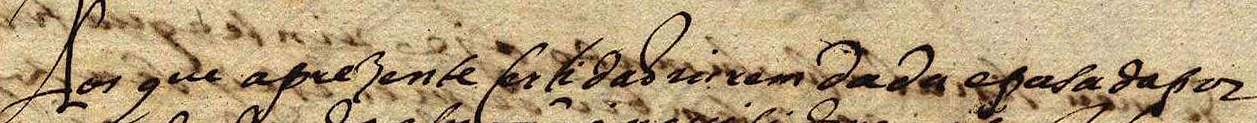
Aos que a prezente Certidão uirem dada e pasada por
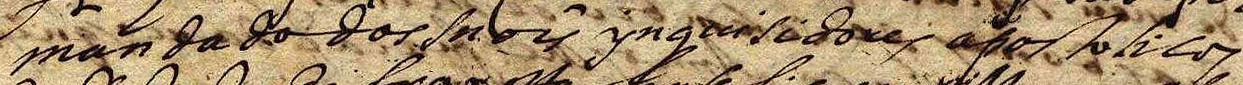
mandado dos snors̄ ynquisidores apostolicos
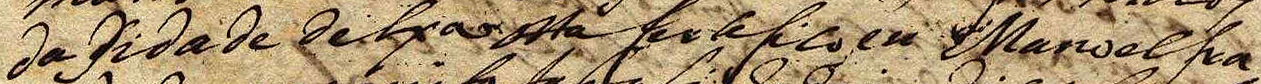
da Sidade de Lxa etta Certefico eu Manoel fra
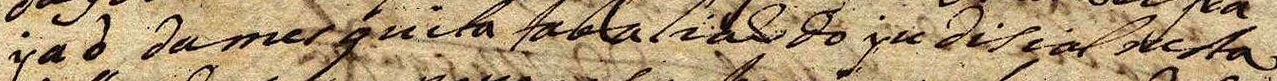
yaõ da mesquita tabaliaõ do yudisial nesta
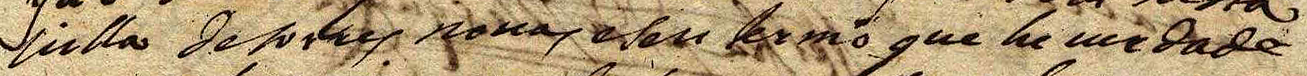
uilla de torres nouas e seu termo que he uerdade
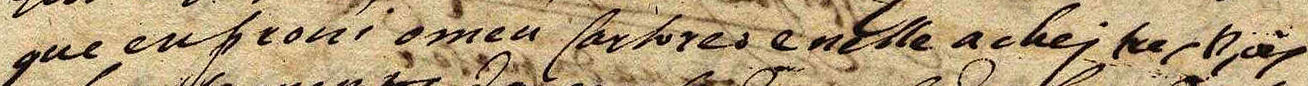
que eu proui o meu Cartoreo e nelle achej tres Rois
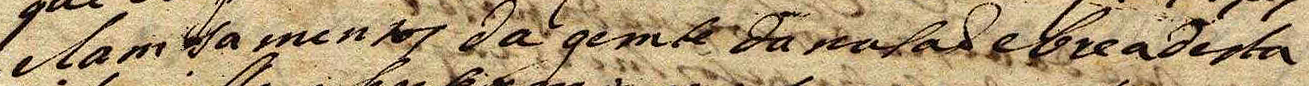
e lamsamentos da gemte da nasaõ ebrea desta
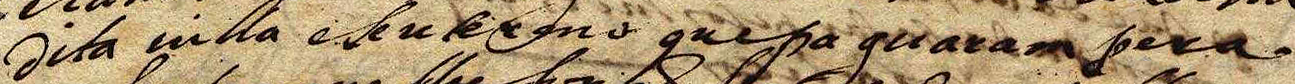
dita uilla e seu termo que paguaram pera
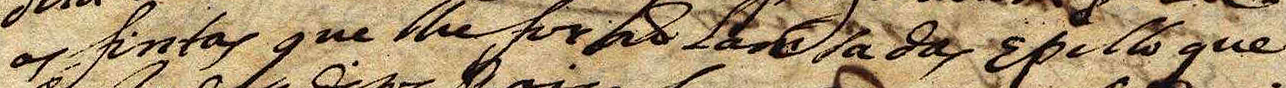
as fintas que lhe foraõ Lamsadas E pello que
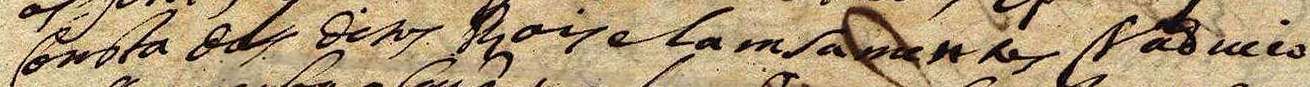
Consta dos ditos Rois e lamsamentos Naõ ueio
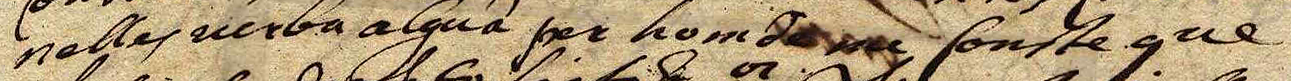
nelles uerba alguā per homde me Conste que
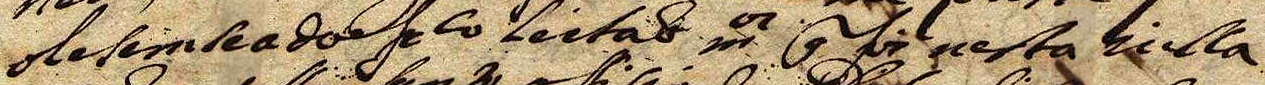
o lesemseado frco leitaõ mor q̄ foi nesta uilla
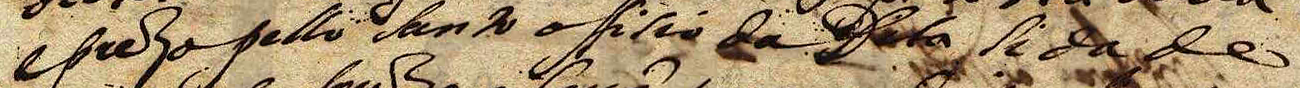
e prezo pello santo offisio da Dita sidade
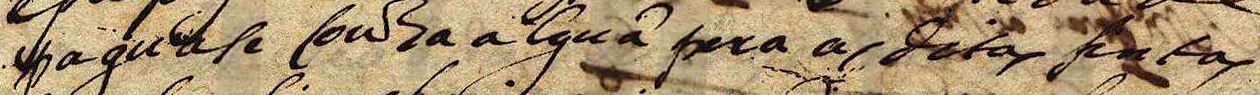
paguase Couza alguā pera as ditas fintas
